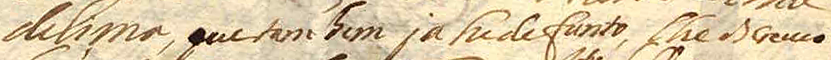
de lima, que tambem ja he defunto, lhe escreueo
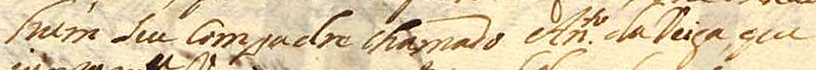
hum seu Compadre chamado An.to da Veiga, que
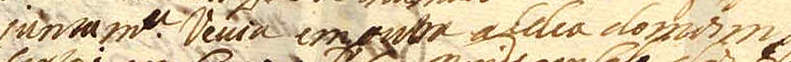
juntam.te Vevia em outra aldea do mesmo
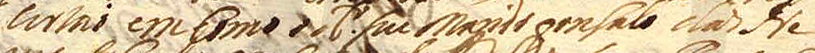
certaõ em Como o d̄.o seu marido gonsalo das Ne
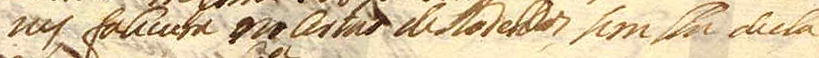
ues falecera no Certão de Rodellos, sem lhe decla
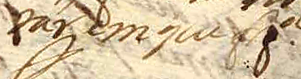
rar em que frg.a
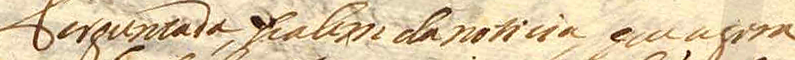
Perguntada, se alem da noticia, que agora
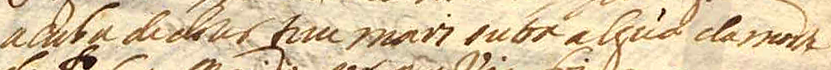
acaba de dizer teue mais outra algūa da morte
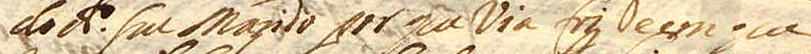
do d̄.o seu marido por que via foi e em que
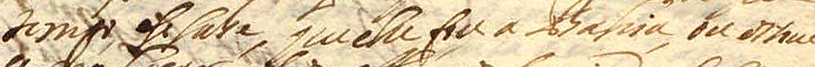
tempo se sabe, que elle foce a Bahia, ou esteue
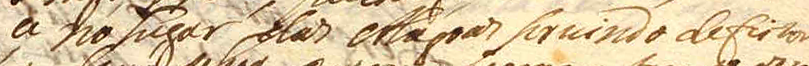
ce no lugar das Alagoas seruindo de feitor
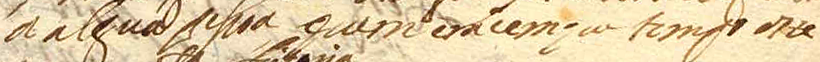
a alguā pessoa, quem era e em que tempo este
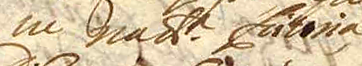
ue na d̄.ta feitoria
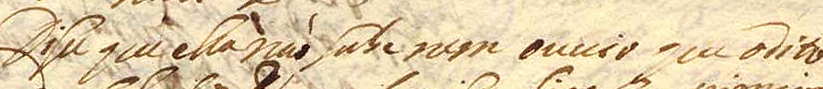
Disse que ella naõ sabe nem ouuio que o dito
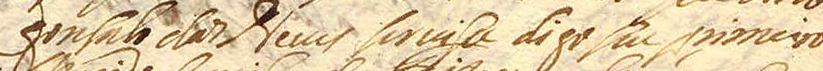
gonsalo das Neues servisse digo seu primeiro
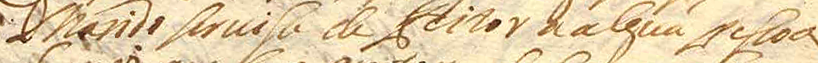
Marido seruisse de Feitor a alguā pessoa
